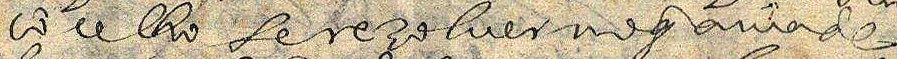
cōcelho se rezoluer no q̄ auia de
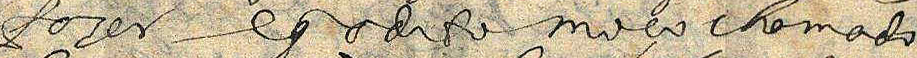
fazer e q̄ o dito moço chamado
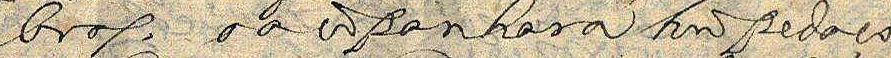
bras o acōpanhara hū pedaço
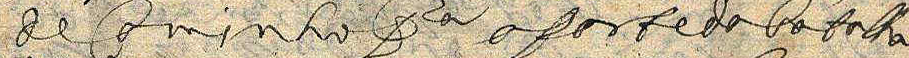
de Caminho pra a parte da batalha
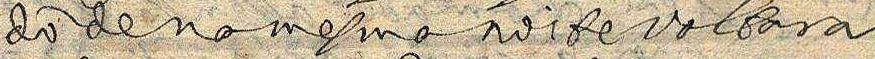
dōde na mesma noite voltara
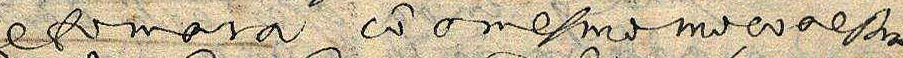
e tomara cō o mesmo moço a estra
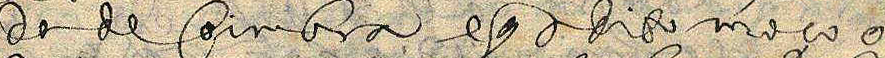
da de Coimbra e q̄ o dito moço o
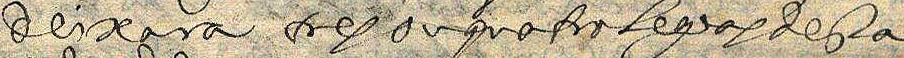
deixara tres ou quatro legoas desta
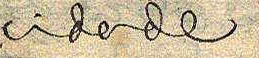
cidade
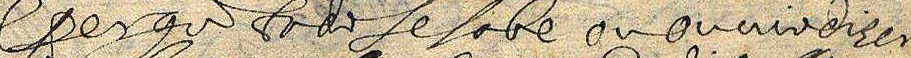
E pergūtado se sabe ou ouuio dizer
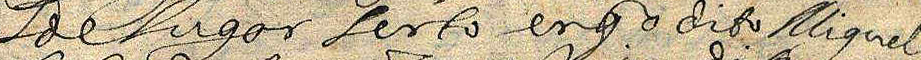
de lugar serto en q̄ o dito Miguel
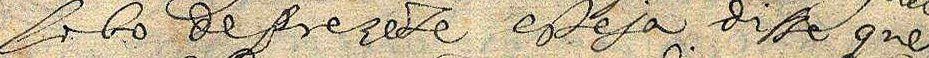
lobo de prezēte esteja disse que
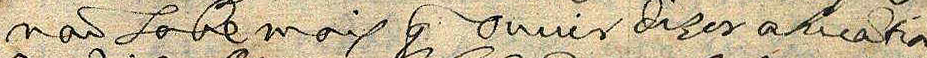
naõ sabe mais q̄ ouuir dizer a huā tia
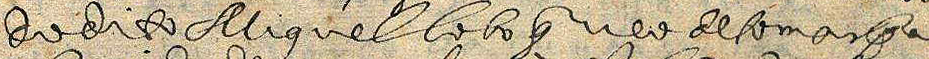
do dito Miguel lobo q̄ ueo de tomar pra
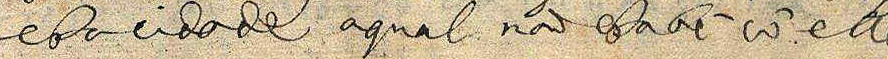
esta cidade a qual naõ esta bem cō elle
